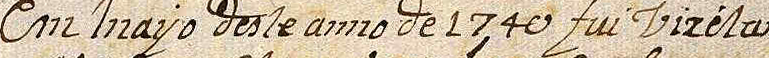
Em mayo deste anno de 1740 fui vizitar
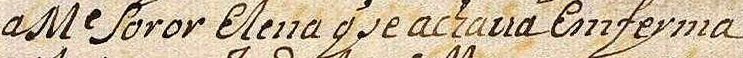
a Me Soror Elena q̄ se achava Emferma
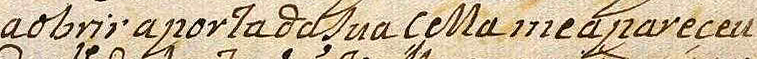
aobrir a porta da sua cella me apareçeu
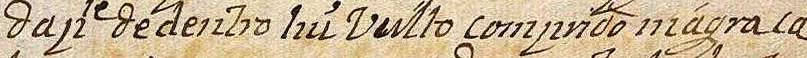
da pte de dentro hū vulto comprido mágra ca
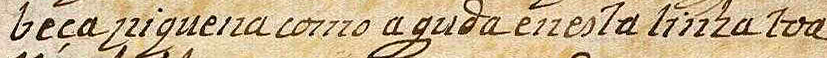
beça piquena como aguda e nesta tinha toa
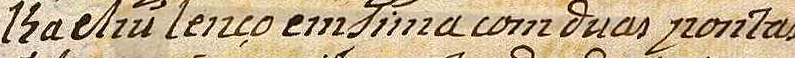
lha e hū lenço em sima com duas pontas
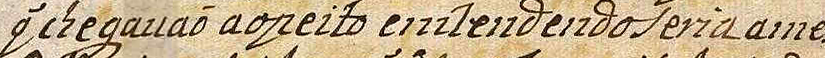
q̄ chegauaõ ao peito emtendendo seria a mes
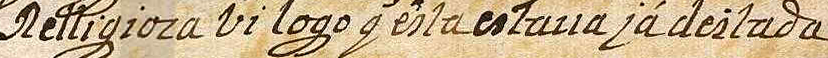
Relligioza vi logo q̄ esta estaua já deitada
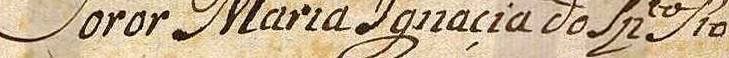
Soror Maria Ignaçia do Spto Sto
